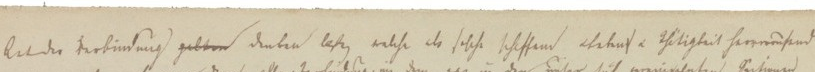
Art der Verbindung gelten denken lasse, welche als solche schaffend & Leben &
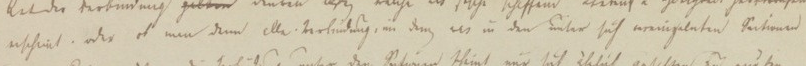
erscheint oder ob man denn alle Verbindung, in dem, was in den unter sich vereinzelnten Sectionen
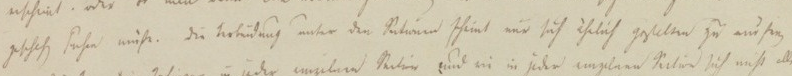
geschehen suchen müsse. Die Verbindung unter den Sectionen scheint mir sich ähnlich gestalten zu müssen,
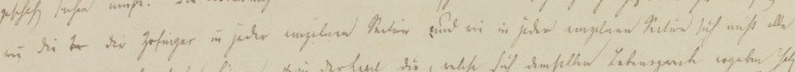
wie die der Zofinger in jeder einzelnen Section und wie in jeder einzelnen Section sich nicht alle
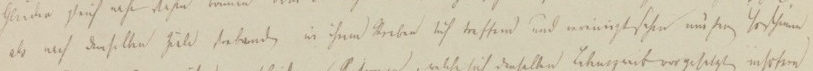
als nach demselben Ziele strebend, in ihrem Streben sich treffend und vereinigt sehen müssen, so scheinen
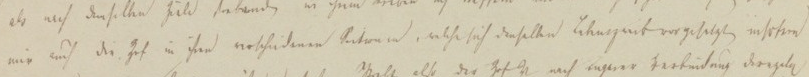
mir auch die Zof. in ihren verschiedenen Sectionen, welche sich denselben Lebenszweck vorgesetzt, insofern
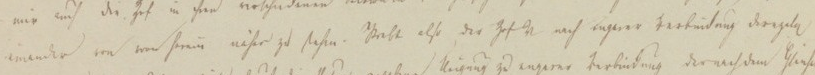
einander von vorn herein näher zu stehen. Strebt also der Zof.V. nach engerer Verbindung der ezelnen
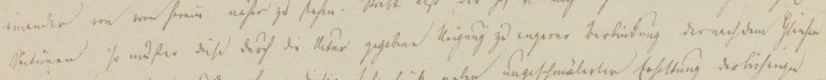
Sectionen so muß er diese durch die Natur gegebene Neigung zu engerer Verbindung der nach dem Gleichen
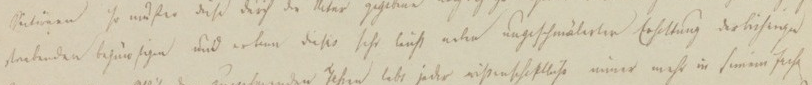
strebenden begünstigen und er kann dieses sehr leicht neben ungeschmälerter Erhaltung des bisherigen
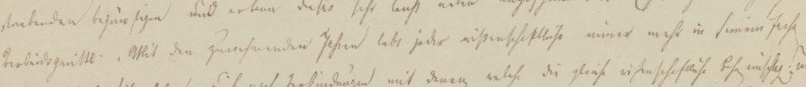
Verbindszwecks. Mit den zunehmenden Jahren lebt jeder wissenschaftliche immer mehr in seinem Fache
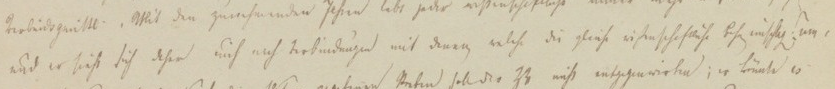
und er sieht sich daher auch nach Verbinungen mit denen, welche die gleiche wissenschaftliche Bahn einschlagen,
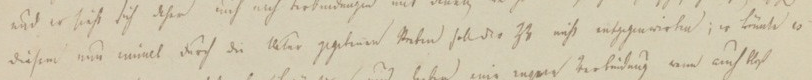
diesem nun einmal durch die Natur gegebenen Streben soll der ZV nicht entgegenwirken; er könnte es
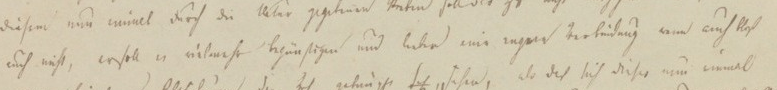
auch nicht, er soll es vielmehr begünstigen und lieber eine engere Verbindung wenn auch bloß
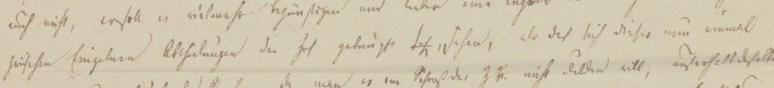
zwischen Einzelnen Abtheilungen die Zof. geknüpft, sehen, als daß sich dieses nun einmal
